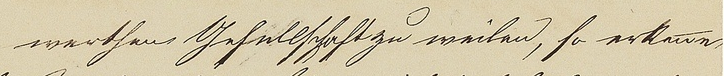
werthen Gesellschaft zu weilen, so erkenne
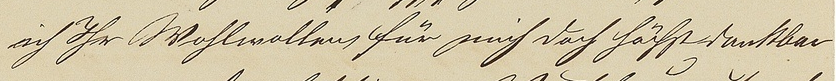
ich Ihr Wohlwollen für mich doch höchst dankbar
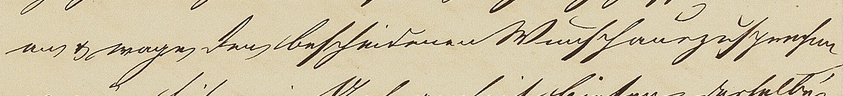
an & wage den bescheidenen Wunsch auszusprechen,
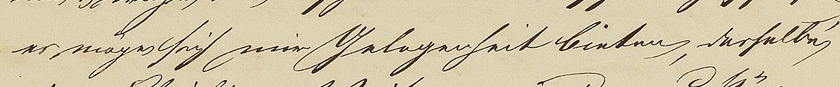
es möge sich mir Gelegenheit bieten, dasselbe
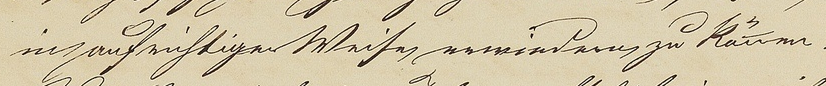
in aufrichtiger Weise erwiedern zu können.
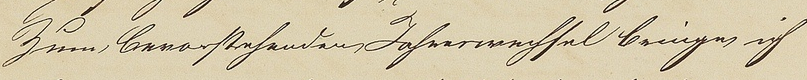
Zum bevorstehenden Jahreswechsel bringe ich
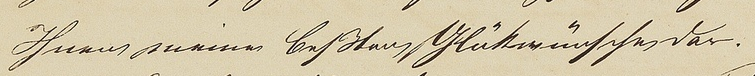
Ihnen meine beßten Glükwünsche dar.
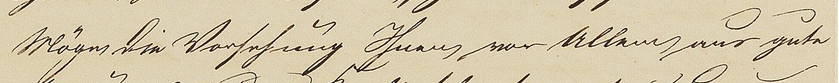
Möge die Vorsehung Ihnen vor Allem aus gute
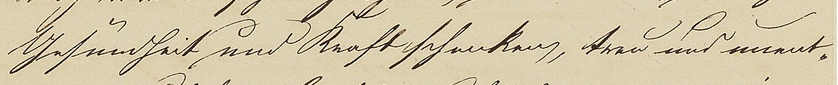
Gesundheit und Kraft schenken, treu und unent-
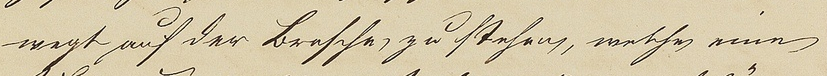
wegt auf der Bresche zu stehen, welche eine
